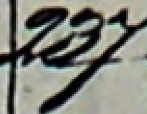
237
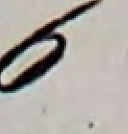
6
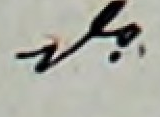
do
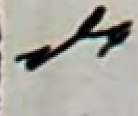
do
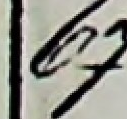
67
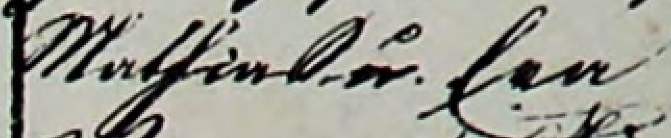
Mathias u. Eva
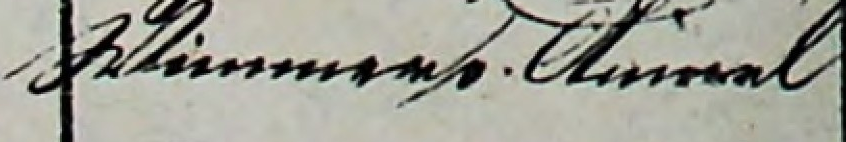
Wimmer v. A???el
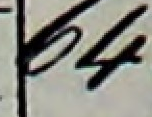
64
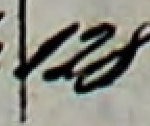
128
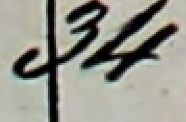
34
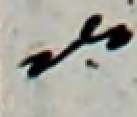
do
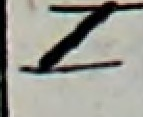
I
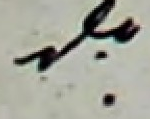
do
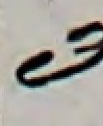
3
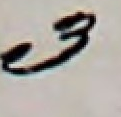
3
